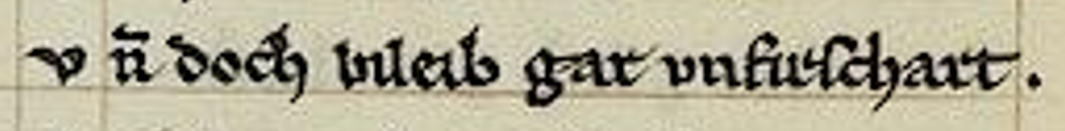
Vn(d) doch bileib gar vnfirſchart.
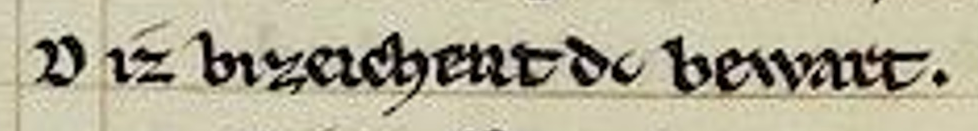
Diz bizeichent d(az) bewart.
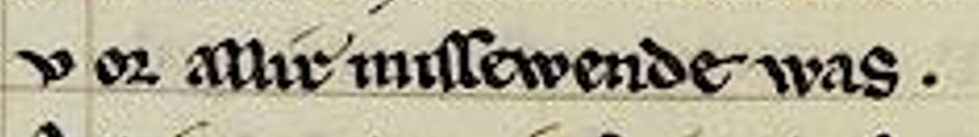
Vor allir miſſewende was.
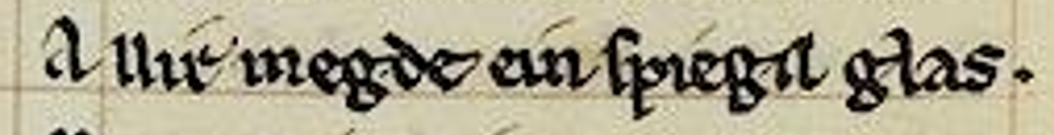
Allir megde ein ſpiegil glas.
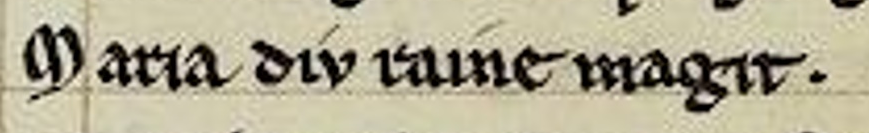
Maria div raine magit.
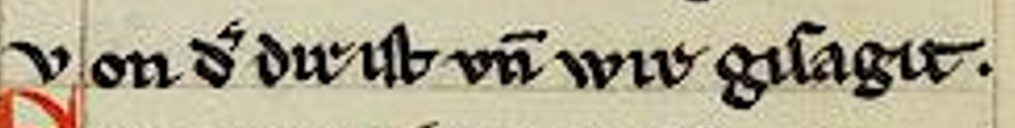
Von d(er) dir iſt vn(d) wir giſagit.
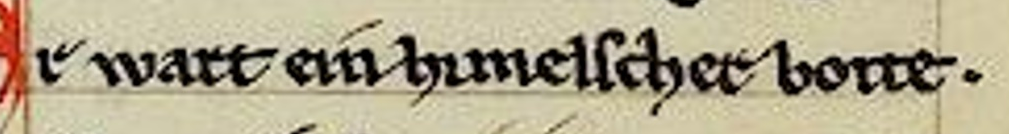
*Er wart ein himelſcher botte.
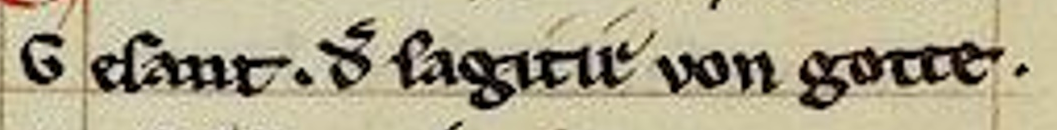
Geſant. D(er) ſagitir von gotte.
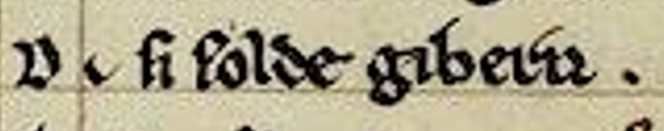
D(az) ſi ſolde gibern.
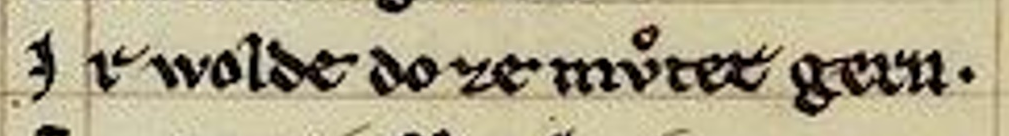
Ir wolde do ze mv°oter gern.
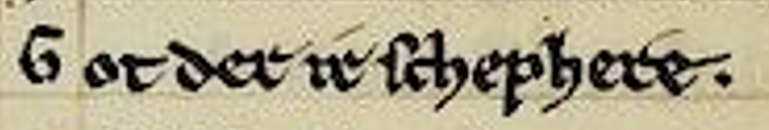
Got der ir ſchephere.
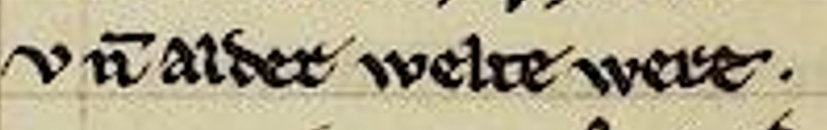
Vn(d) alder welte were.
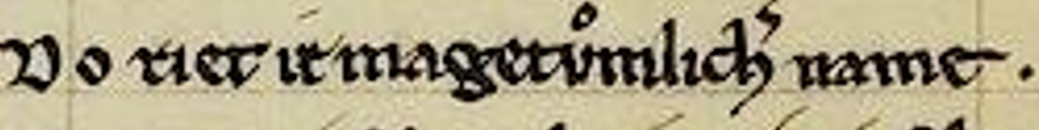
Do riet ir magetv°omlich(er) name.
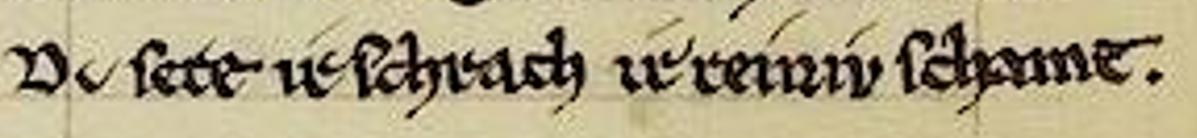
D(az) ſere irſchrach ir reiniv ſchame.
